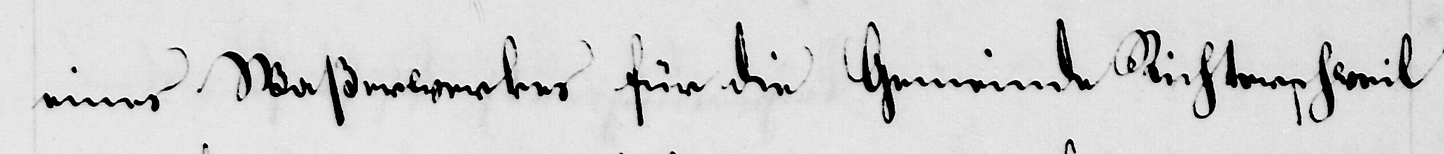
eines Waßerwerkes für die Gemeinde Richterschweil
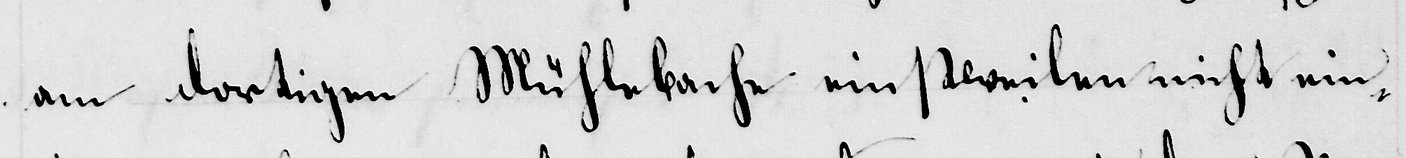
am dortigen Mühlebache einstweilen nicht ein¬
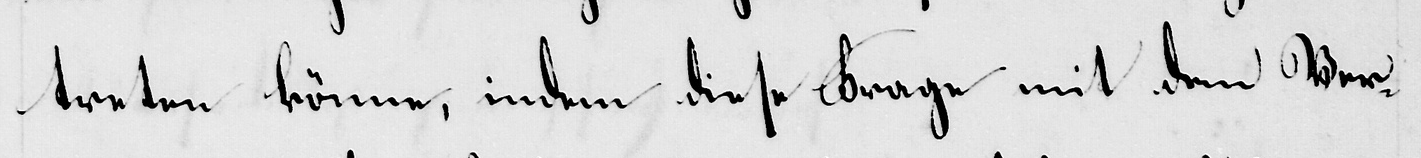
treten könne, indem diese Frage mit dem Ver¬
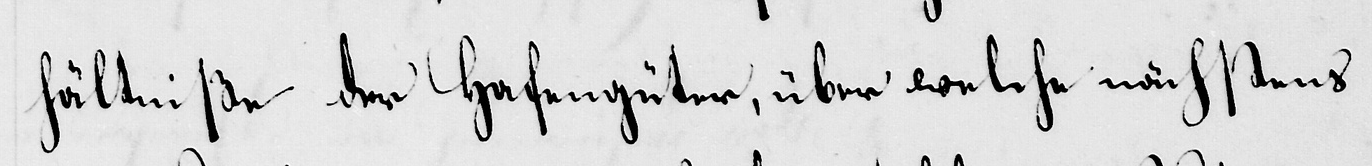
hältniße der Hafengüter, über welche nächstens
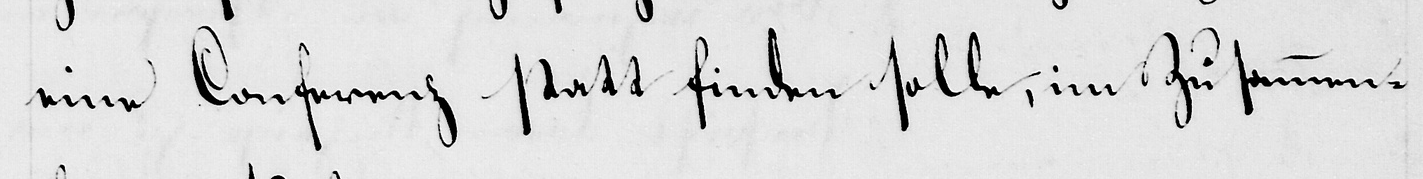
eine Conferenz statt finden solle, im Zusammen¬
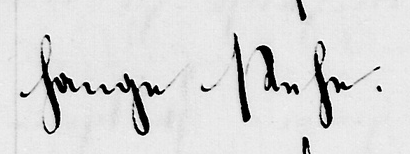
hange stehe.
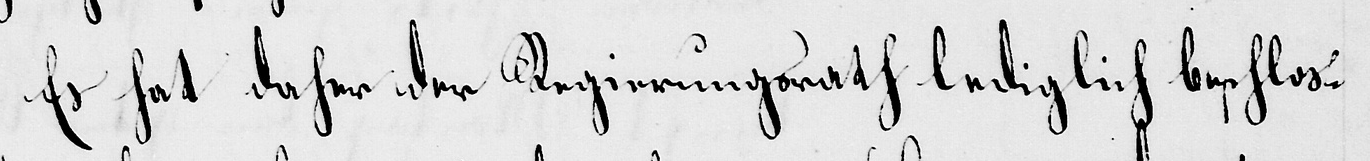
Es hat daher der Regierungsrath lediglich beschlos¬
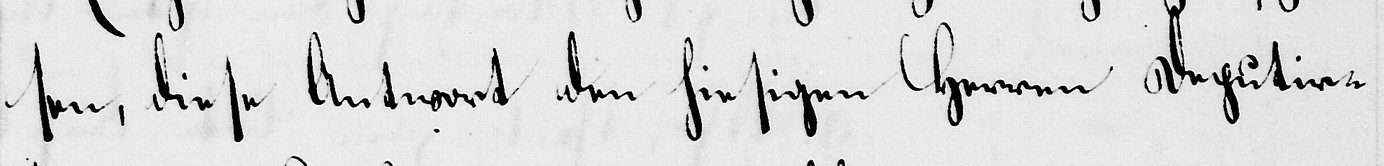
sen, diese Antwort den hiesigen Herren Deputir¬
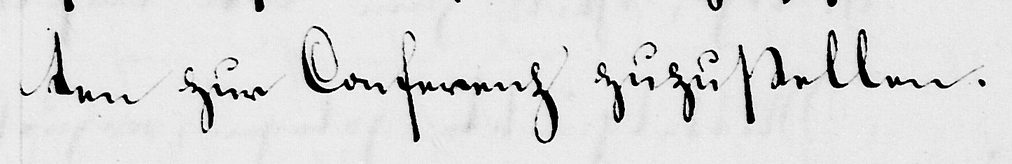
ten zur Conferenz zuzustellen.
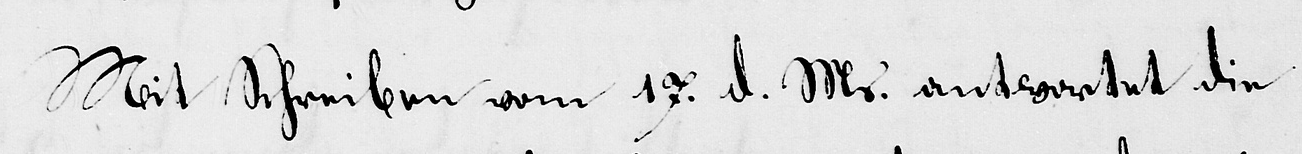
Mit Schreiben vom 17. d. Ms. antwortet die
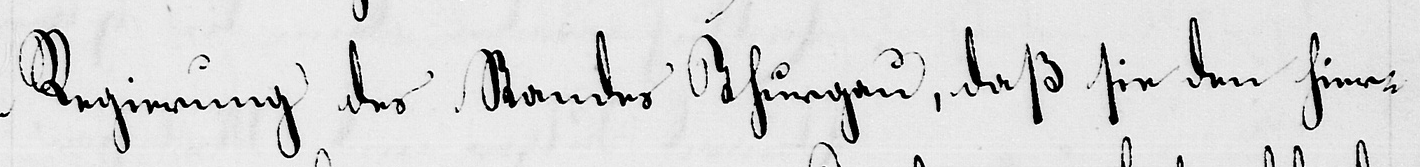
Regierung des Standes Thurgau, daß sie den hier¬
